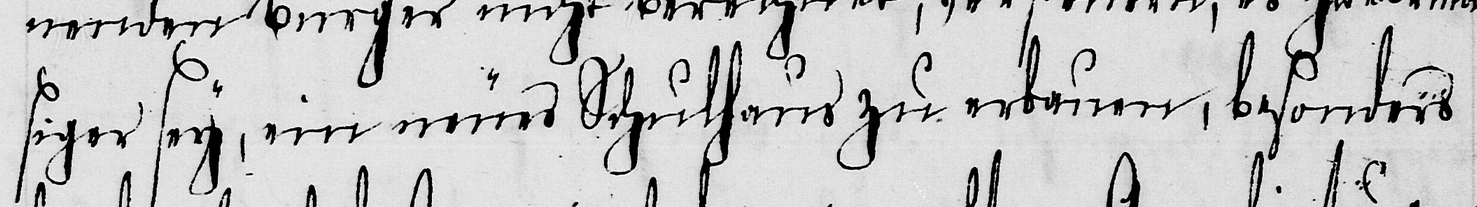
iger sey, ein neues Schulhaus zu erbauen, besonders
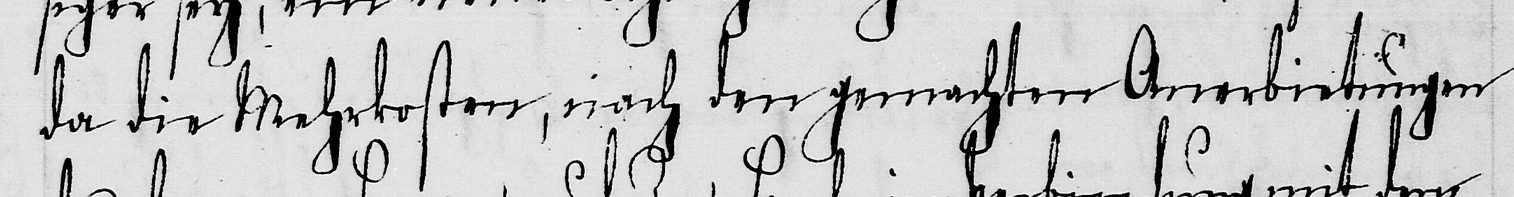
da die Mehrkosten, nach den gemachten Anerbietungen
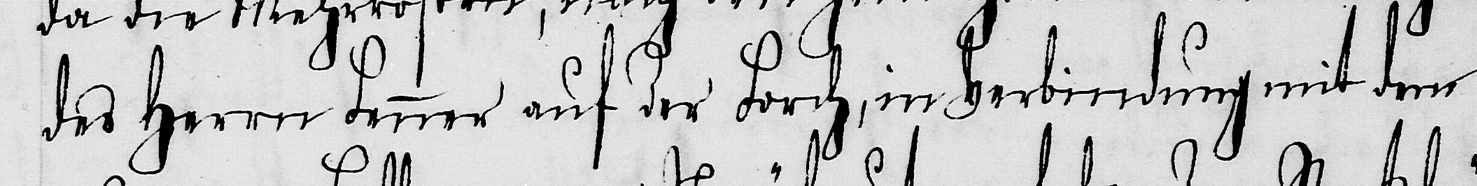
des Herrn Fenner auf der Forch, in Verbindung mit dem
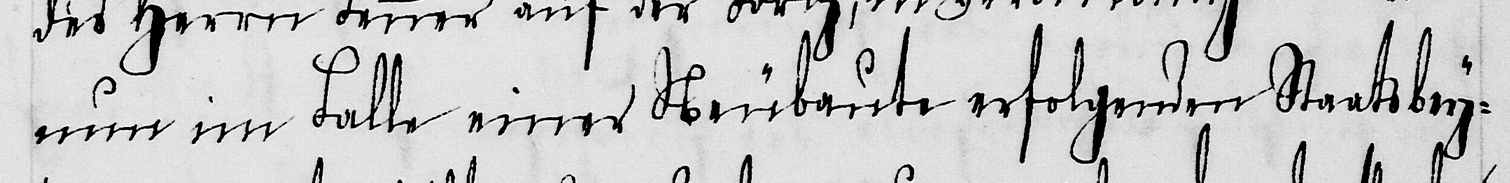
nun im Falle einer Neubaute erfolgenden Vortheil¬
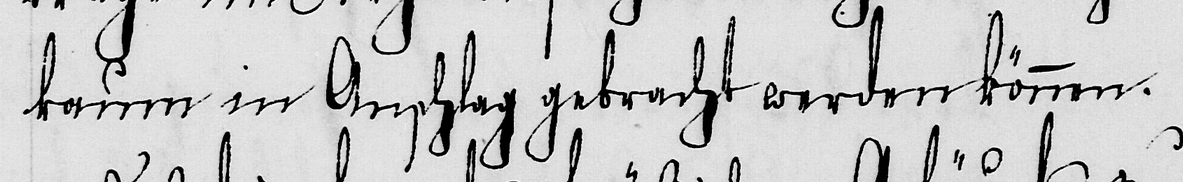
kaum in Anschlag gebracht werden können.
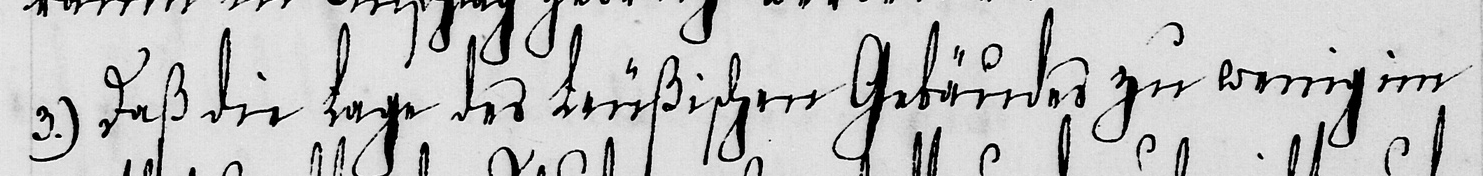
3.) Daß die Lage des Leußischen Gebäudes zu wenig im
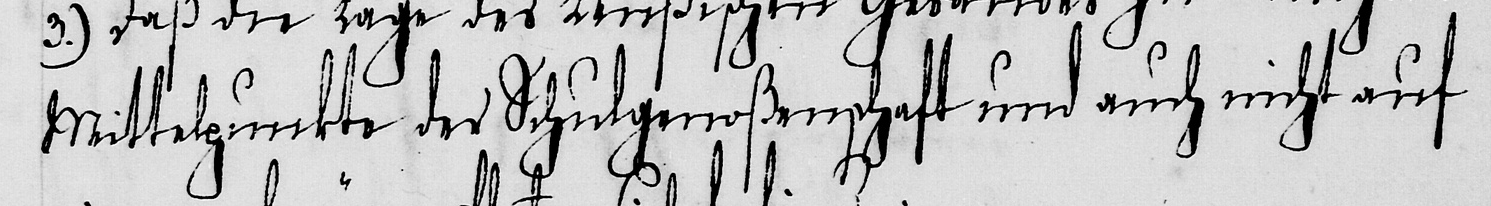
Mittelpunkte der Schulgenoßenschaft und auch nicht auf
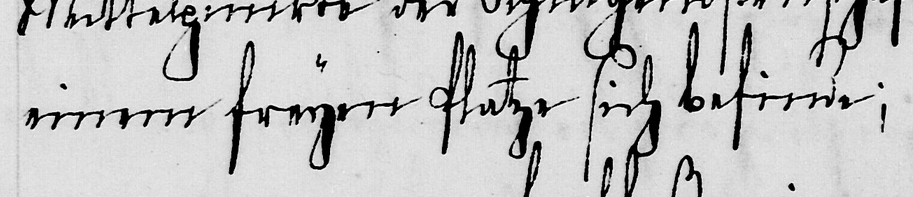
einem freyen Platze sich befinde;
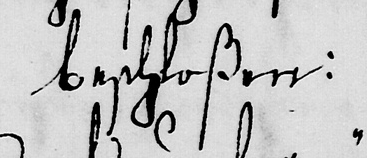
beschloßen:
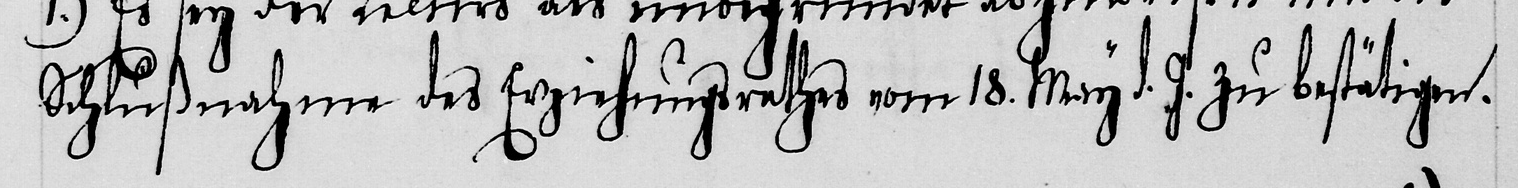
Schlußnahme des Erziehungsrathes vom 18. May d. J. zu bestätige¬
